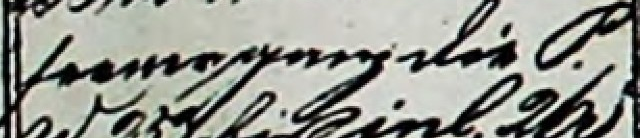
ferner ganz die P.
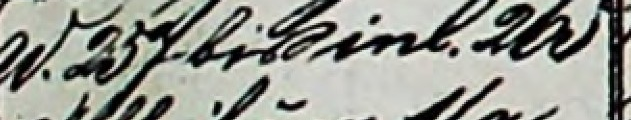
W. 257 bis inl. 265
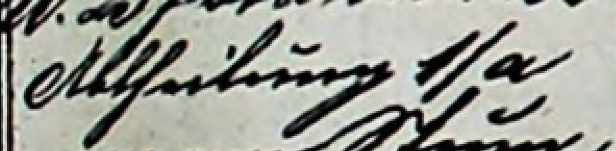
Abtheilung 1/a
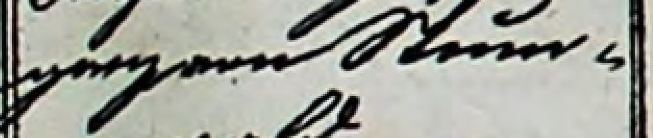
ganz am Stum„
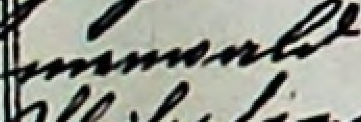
menwald
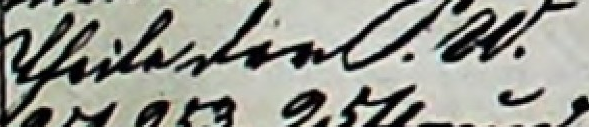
Theile der P.W.
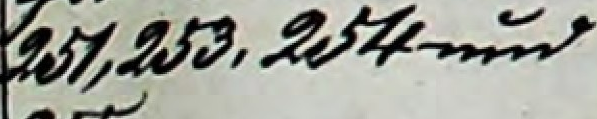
251, 253, 254 und
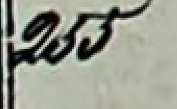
255
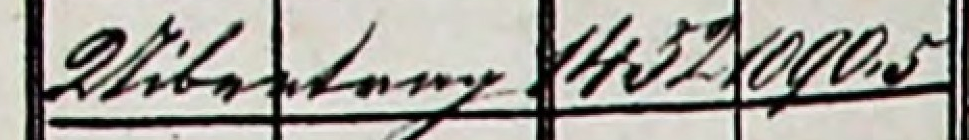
Uibertrag 1452 1090,5
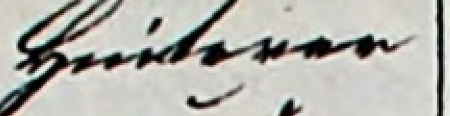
Hinterer
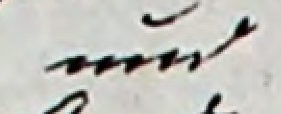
und
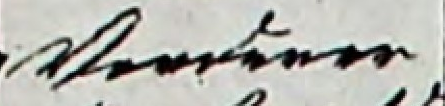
Vorderer
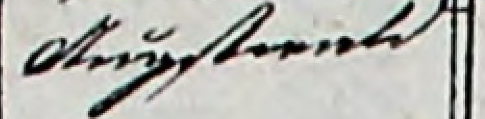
Augstwald
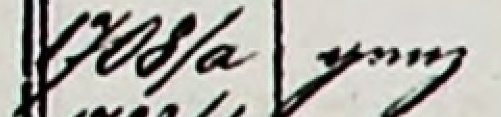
1708/a ganz
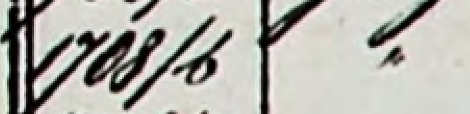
1708/b „
